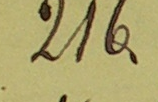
216
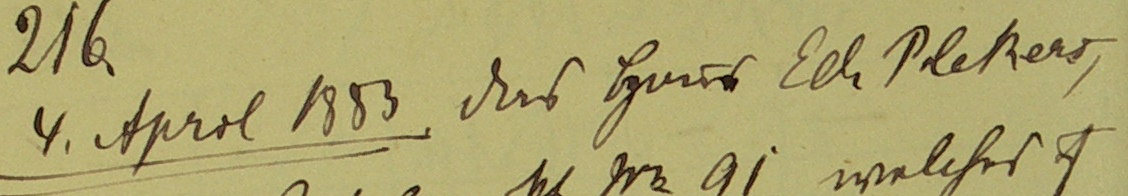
4. April 1883. Das Haus Ed. Plekers
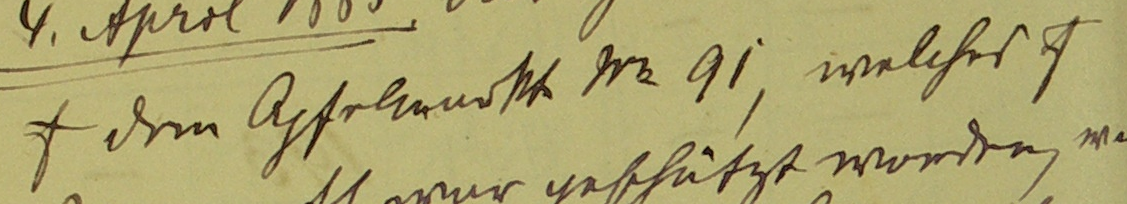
auf dem Apfelmarkt Nr.91, welches auf
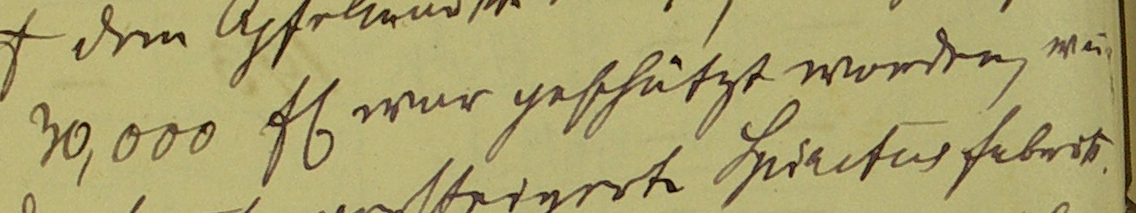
30,000 Fl. war geschätzt worden, wur¬
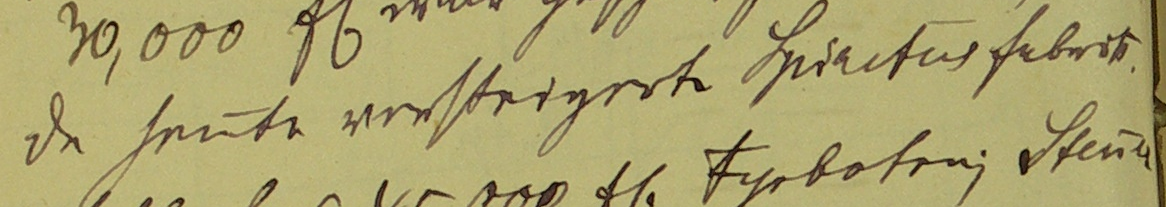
de heute versteigert. Spiritusfabrikant
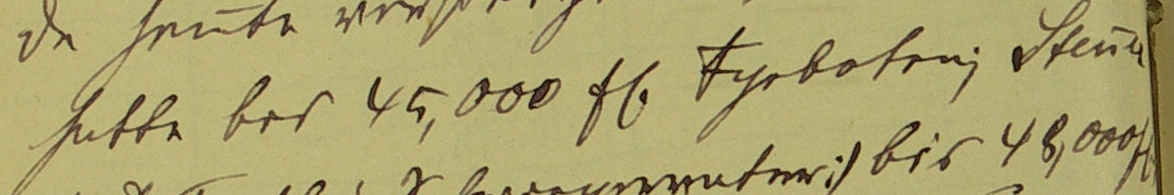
hatte bis 45,00 Fl angeboten,- Stenner
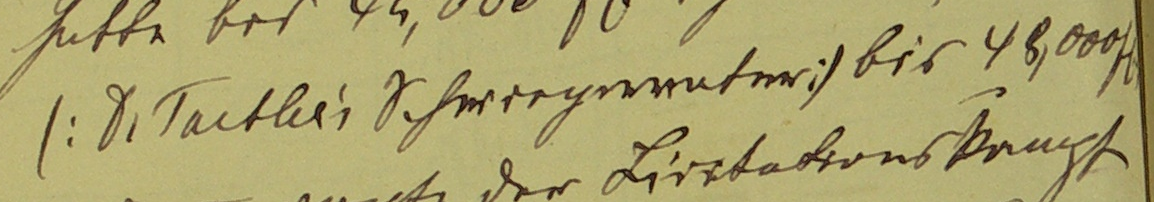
( : Dr. Tartlers Schwiegervater : ) bis 48,000 Fl.
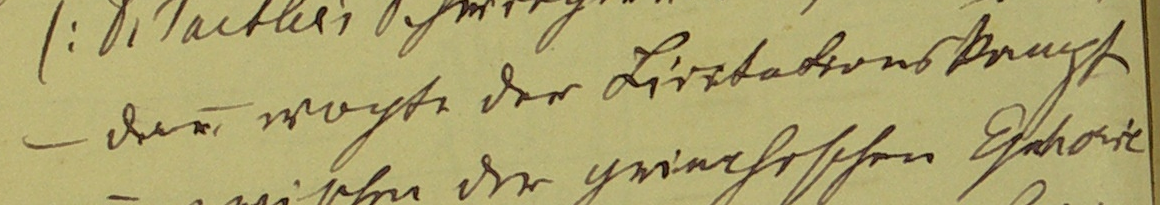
- dann wogte der Licitationskampf
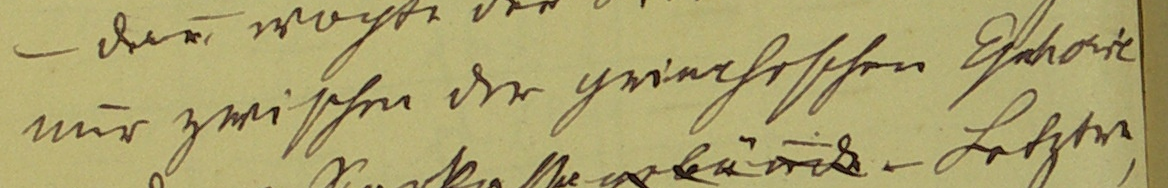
nur zwische der griechischen Gatorie
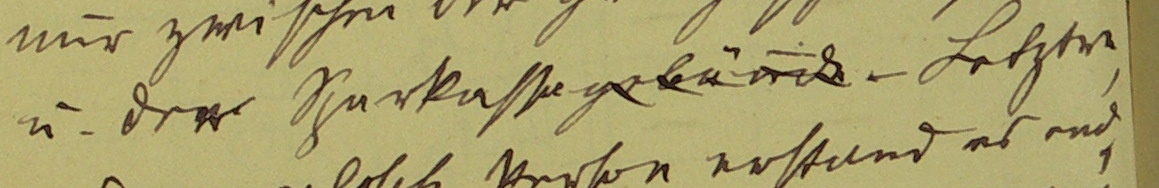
und der Sparkasse –Letztere
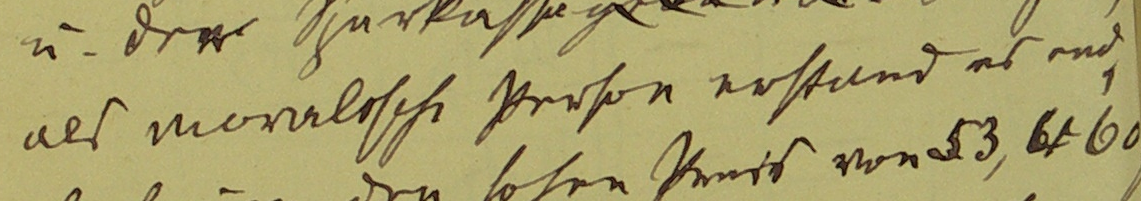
als moralische Person erstand es end¬
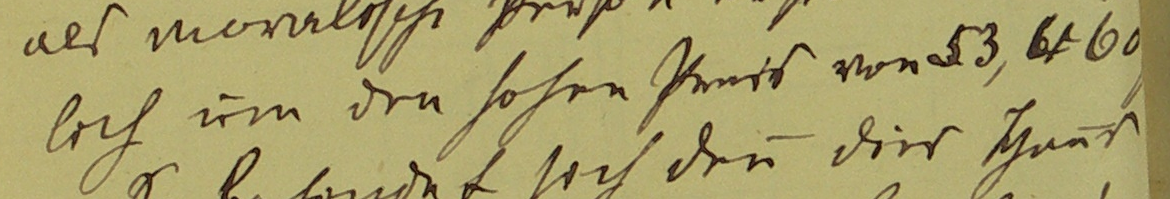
lich um den stolzen Preis von 53,000 Fl.
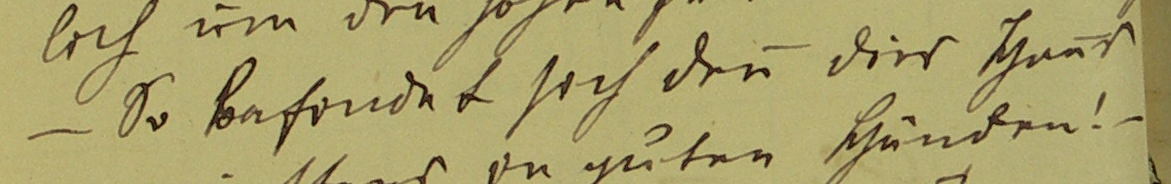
- So befindet sich das Haus
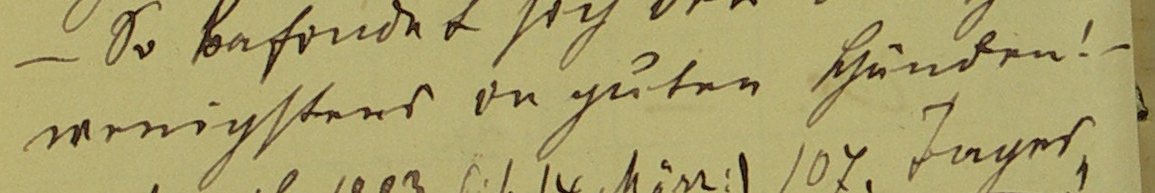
wenigstens in guten Händen !—
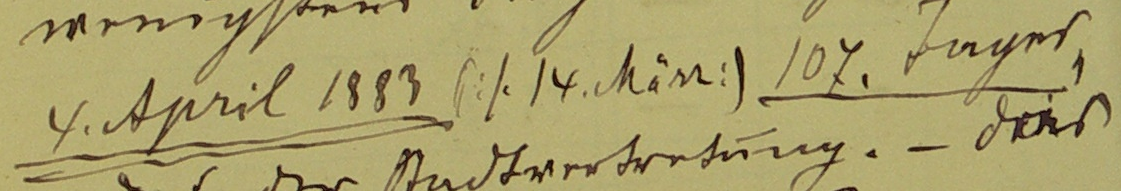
4. April 1883 (.14 März : ) 107-te Tages¬
